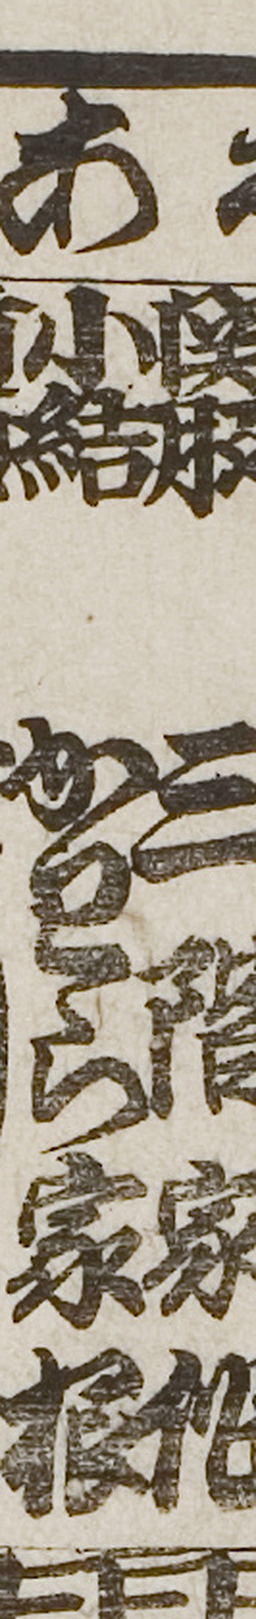小結かわら家根
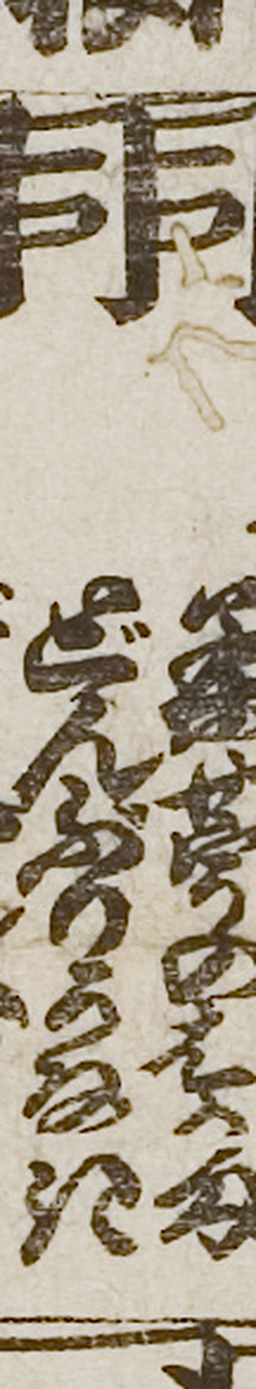同どんぶりうなき
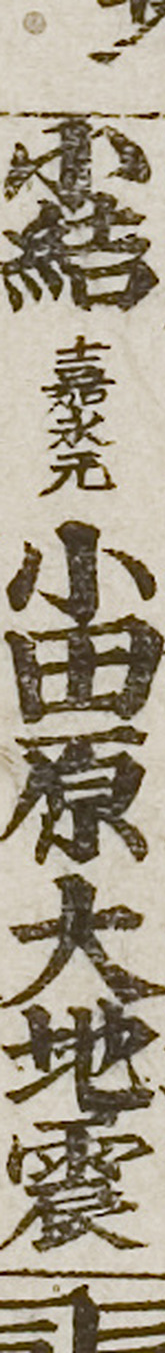小結嘉永元小田原大地震
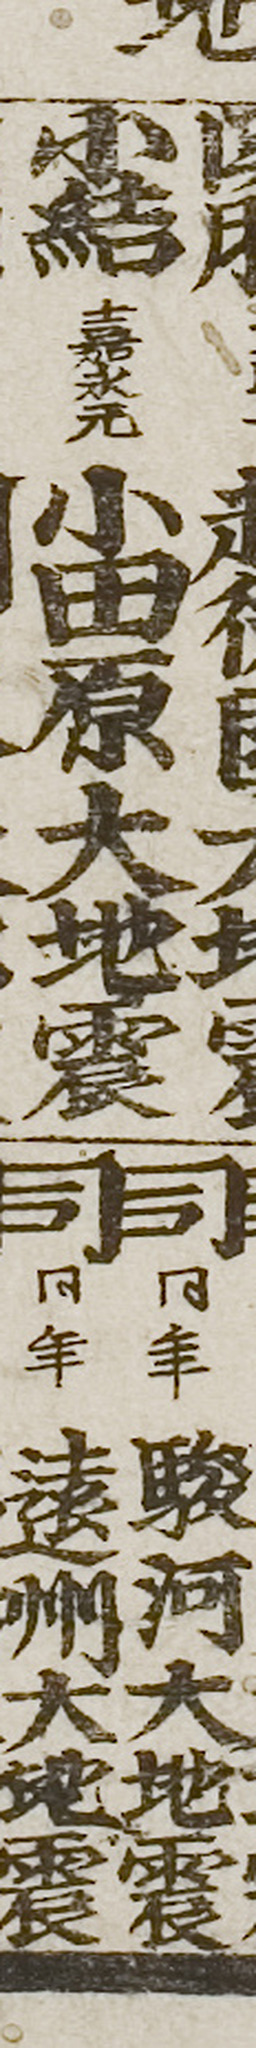小結嘉永元小田原大地震
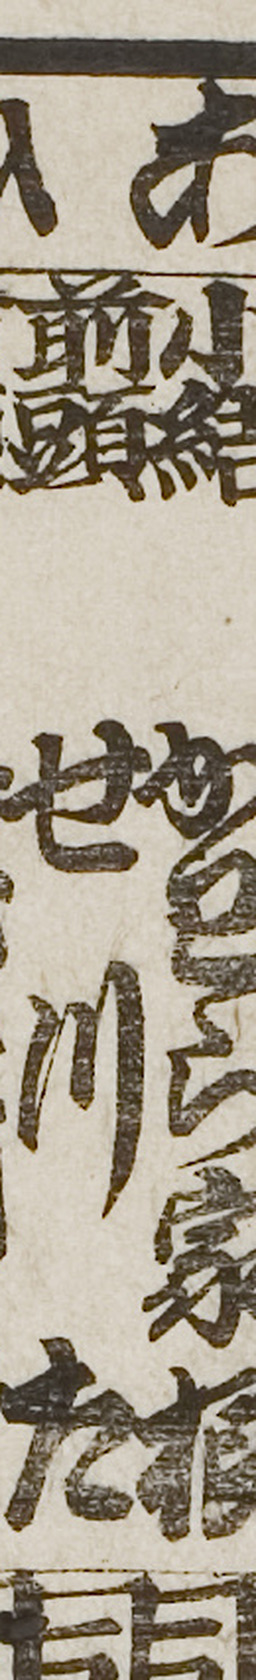前頭せつた
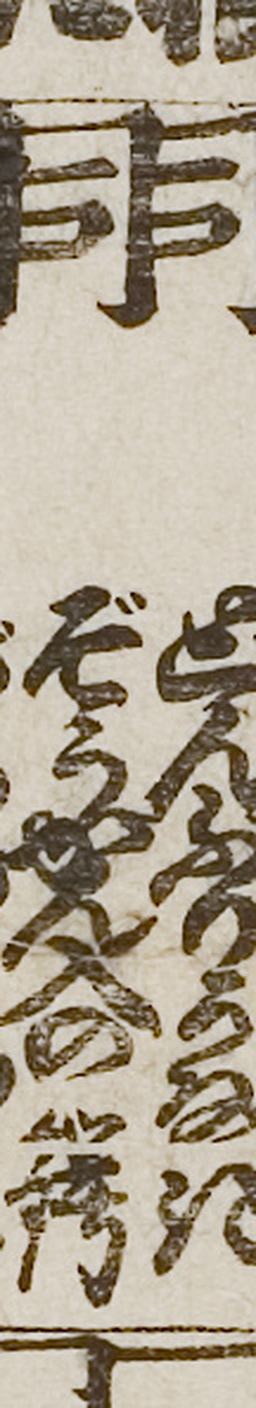同ぞうかん入の鍔
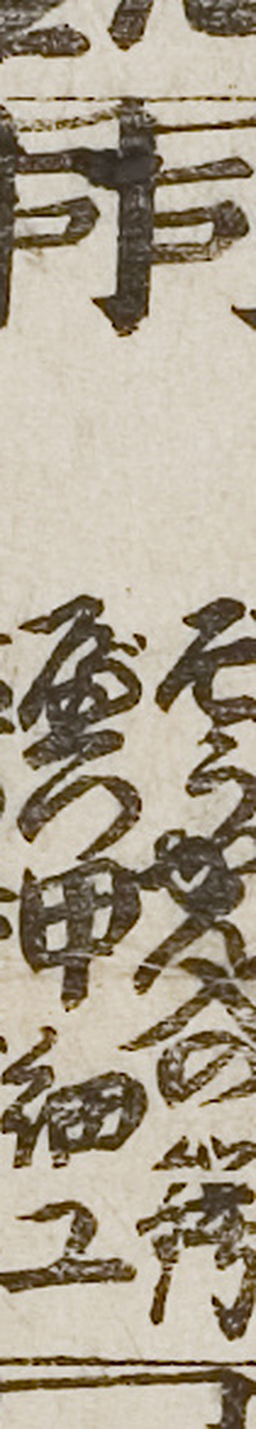同べつ甲細工
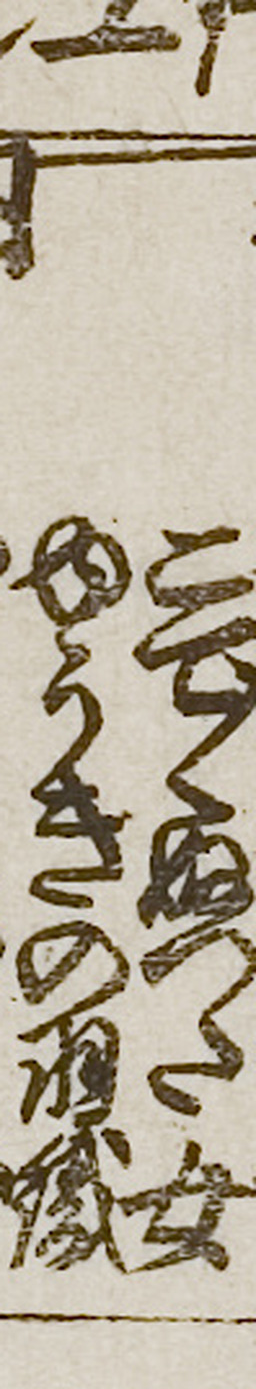同ゆうきの羽織
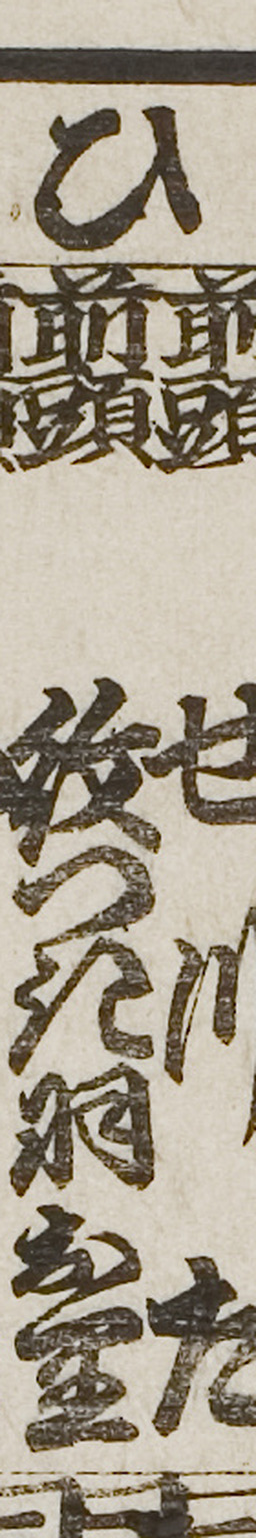前頭紋つき羽おり
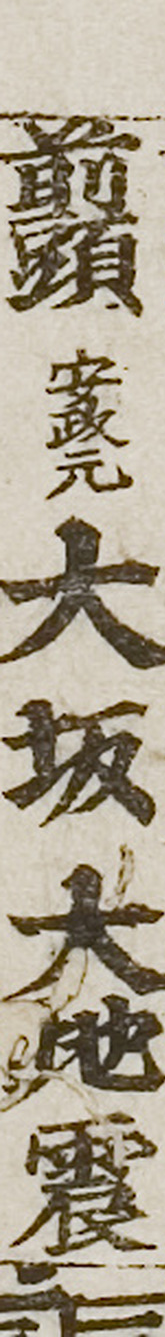前頭安政元大坂大地震
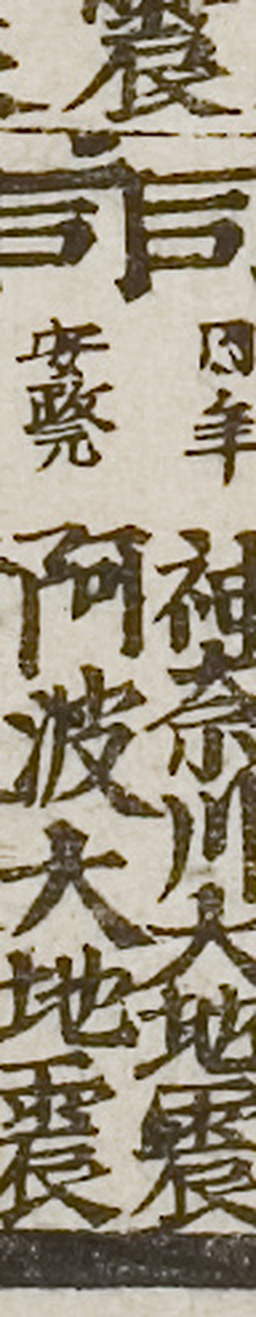同安政元阿波大地震
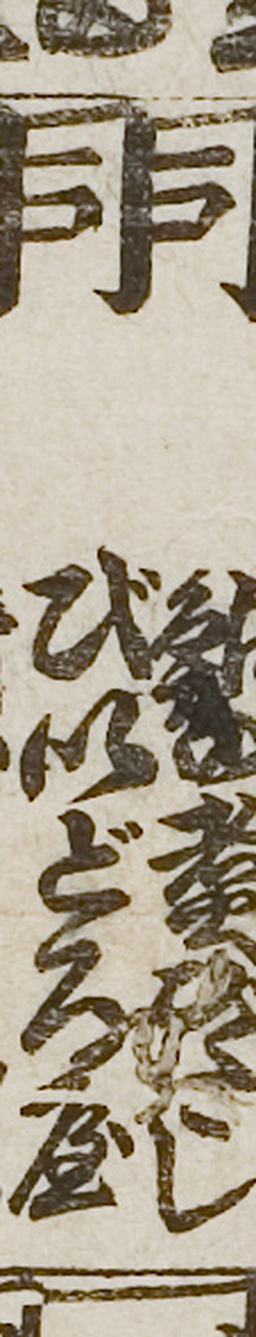同びいどろ屋
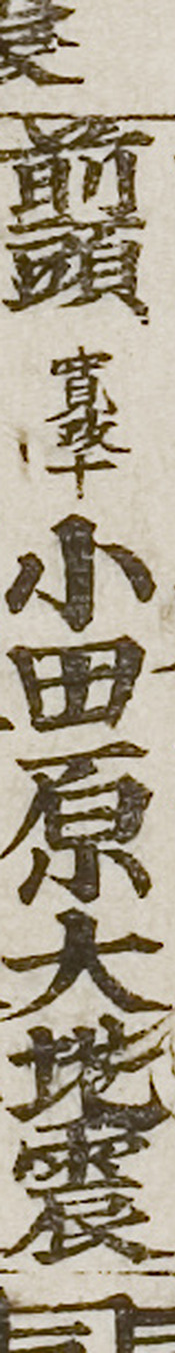前頭寛政十小田原大地震
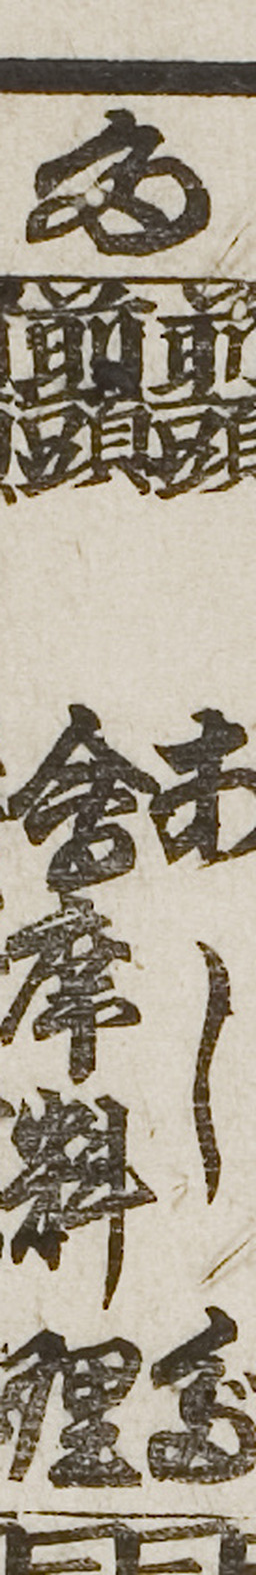前頭會席料理
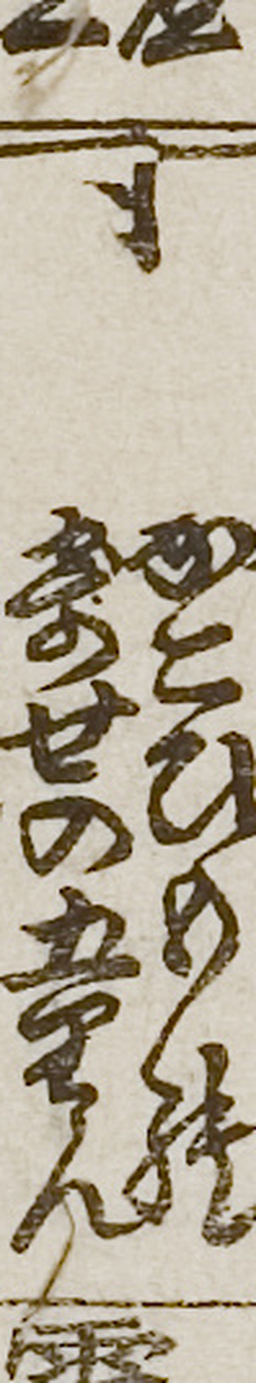同寄せの五りん
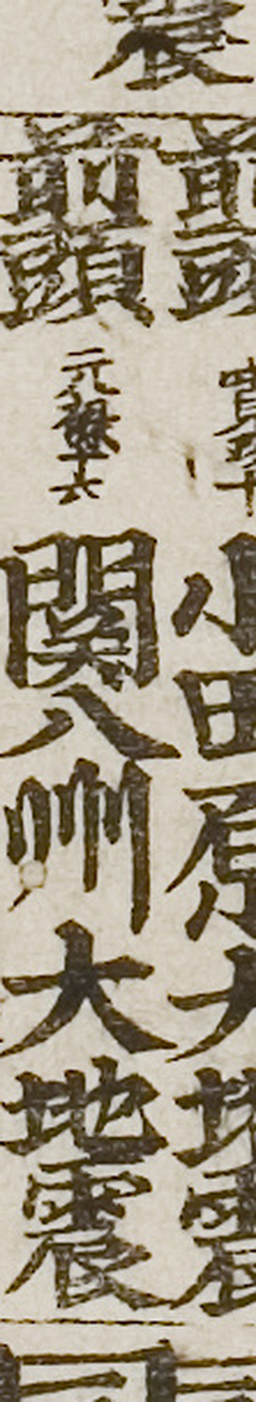前頭元禄十六関八州大地震
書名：世中当座帳
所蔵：東京大学総合図書館 General Library in the University of Tokyo, JAPAN
